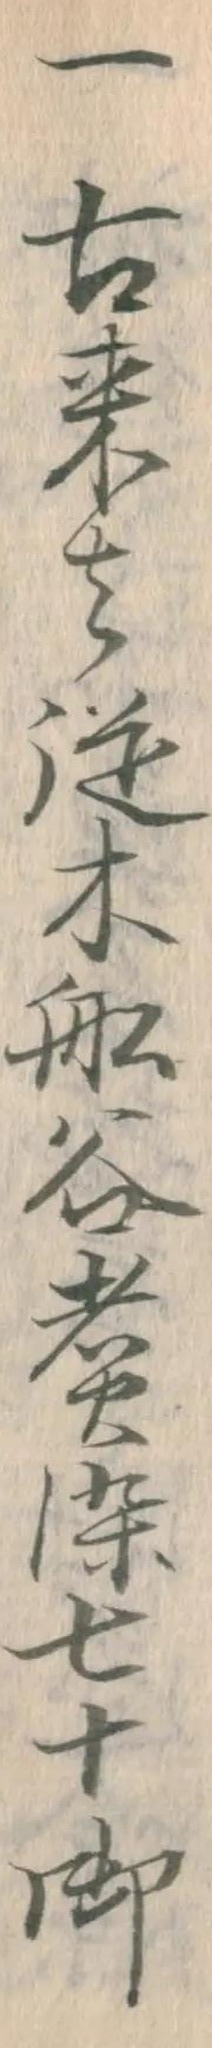一古来は従木船谷煮染七十御
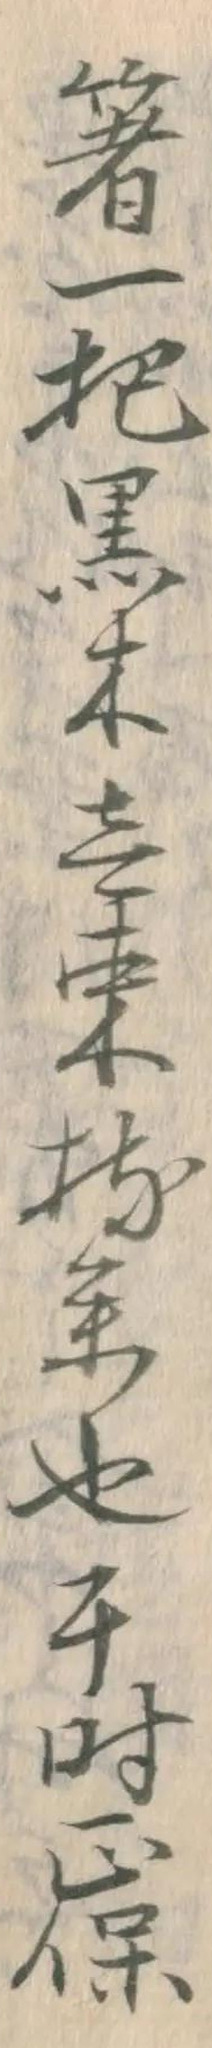箸一把黒木壱束持参也于時正保
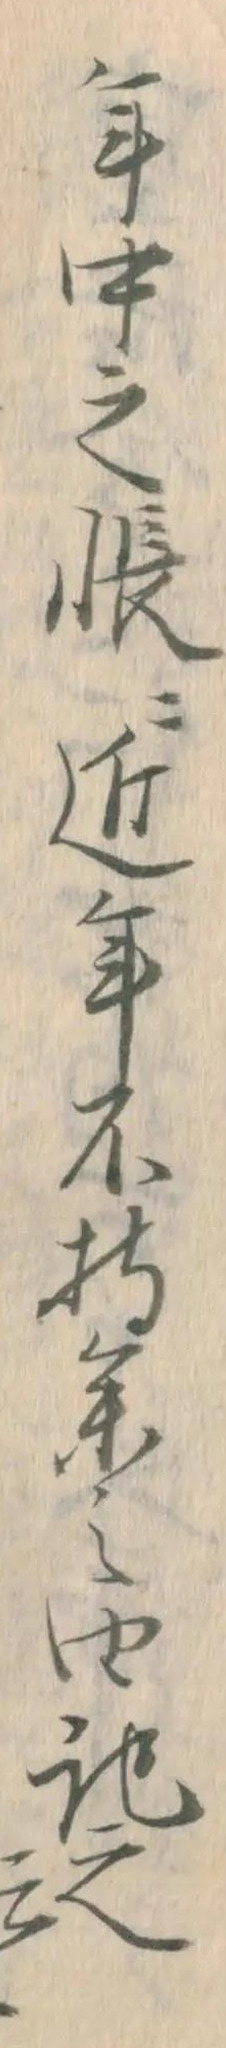年中之帳に近年不持参之由記之云々

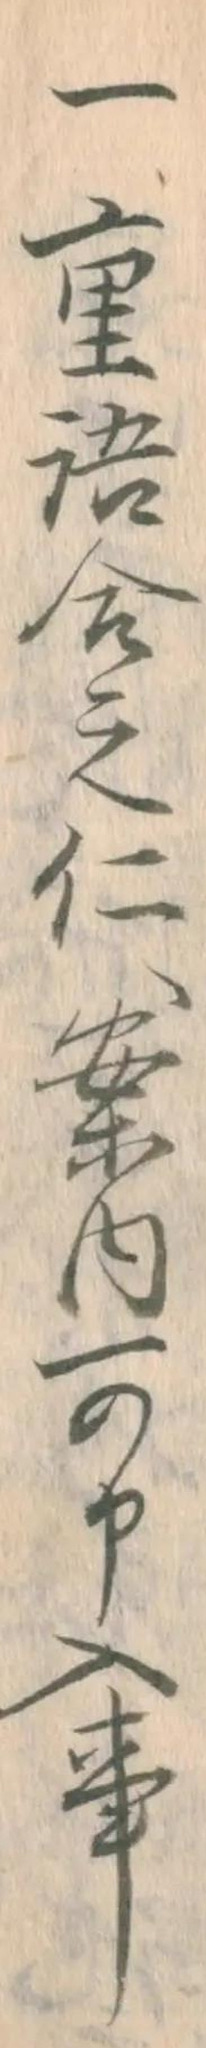一重語合之仁へ案内可申入事
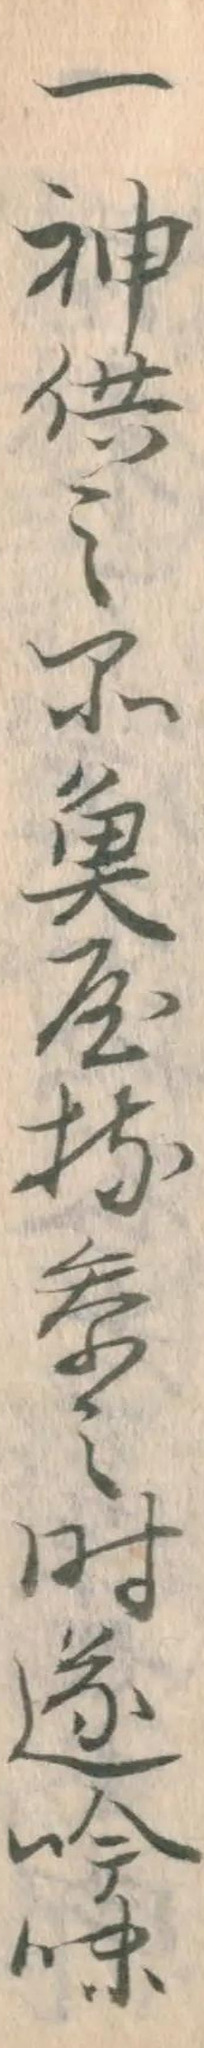一神供之品魚屋持参之時遂吟味
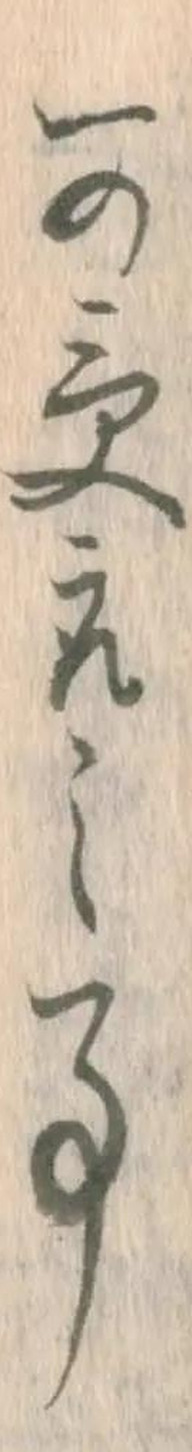可受取之事
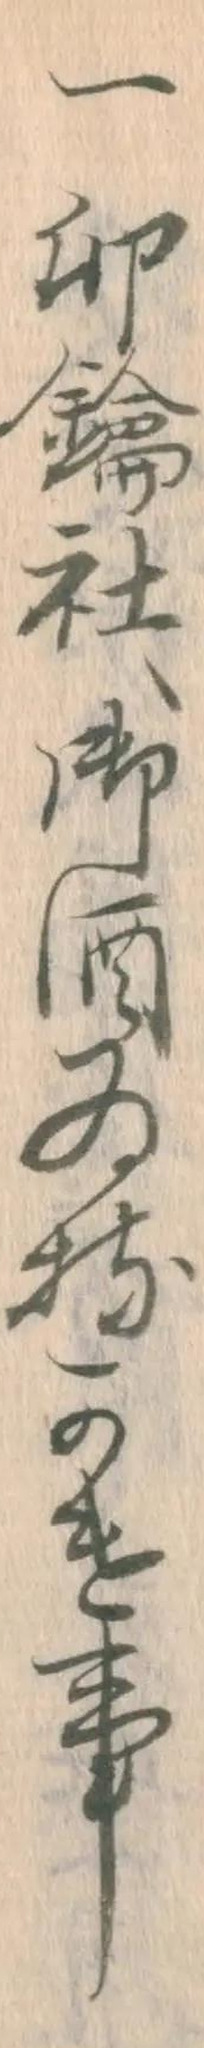一卯鑰社へ御酒為持可遣事
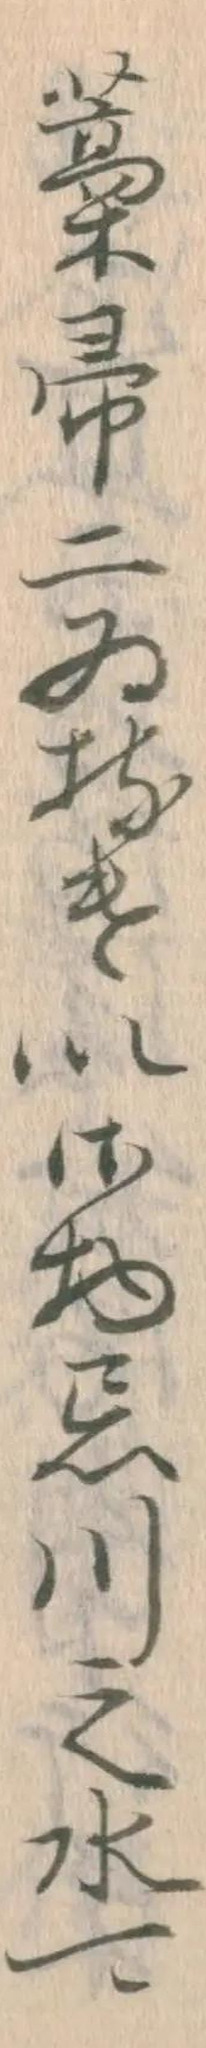藁帚二為持遣以御物忌川之水可
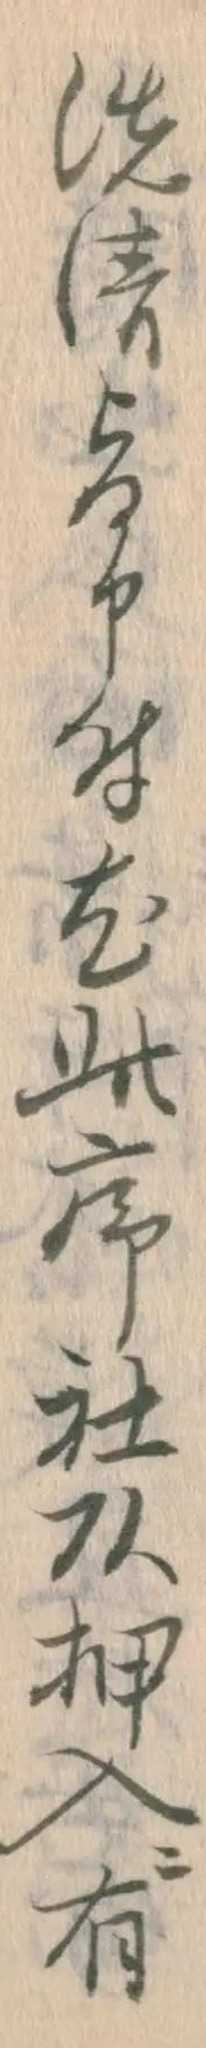洗清旨申付尤此序社頭押入に有
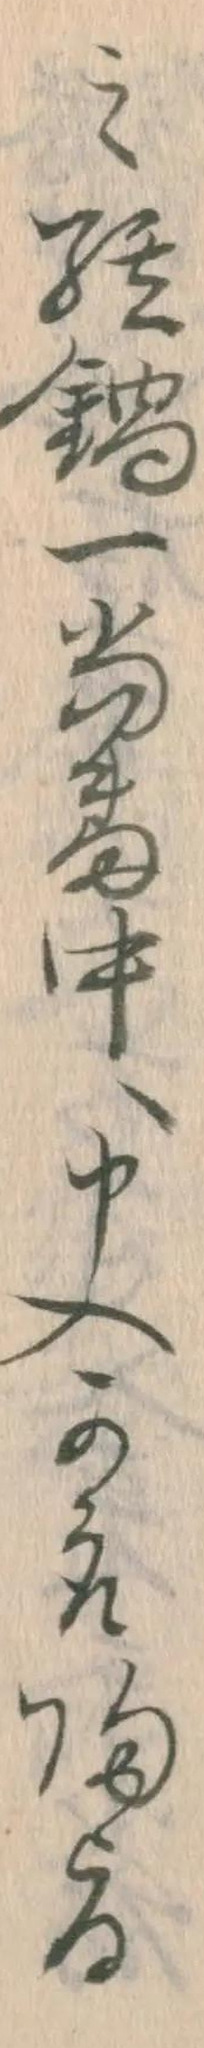之弦鍋一当番中へ申入可取帰旨
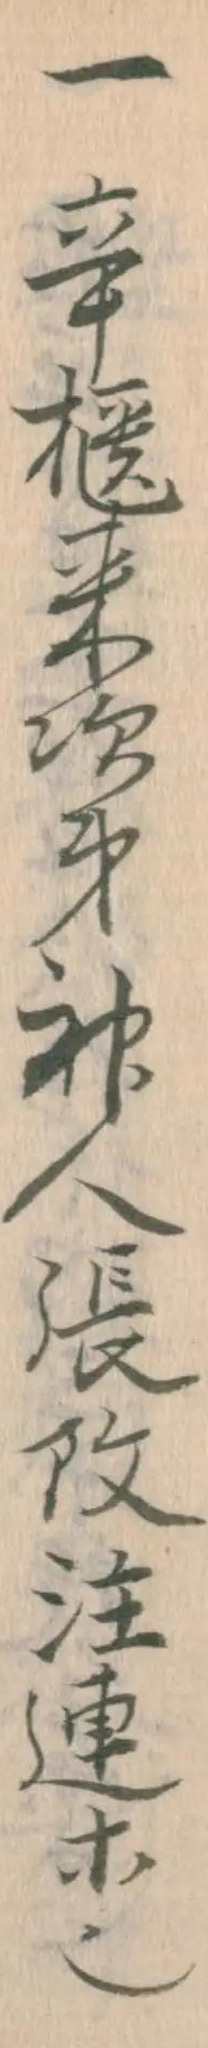一辛櫃来次第神人張改注連等也
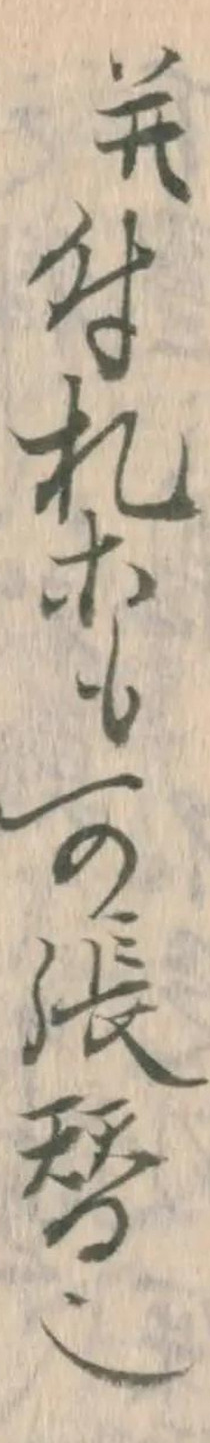并付札等も可張替也
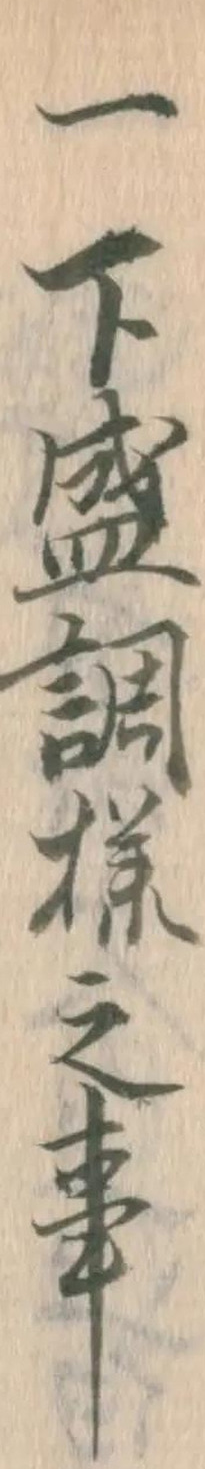一下盛調様之事
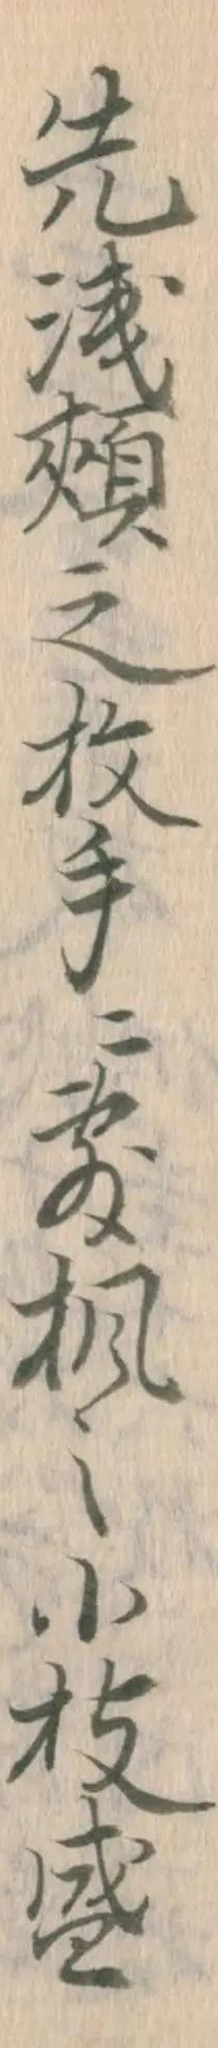先浅頬之枚手に敷楓之小枝盛

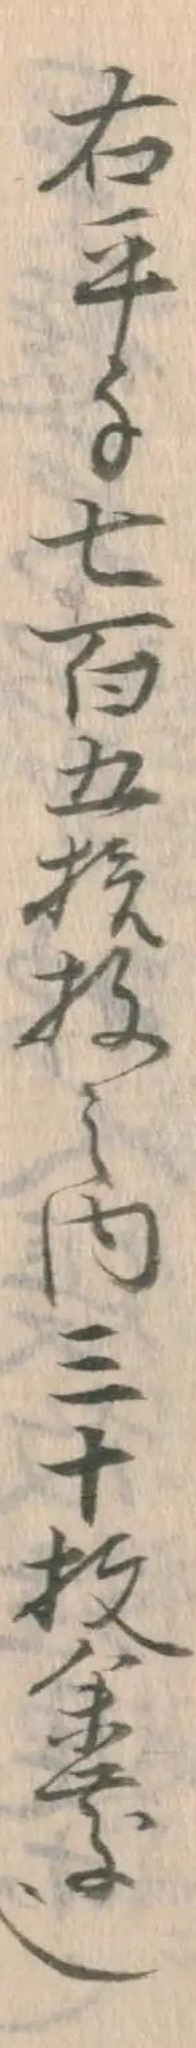右平手七百五拾枚之内三十枚余慶也
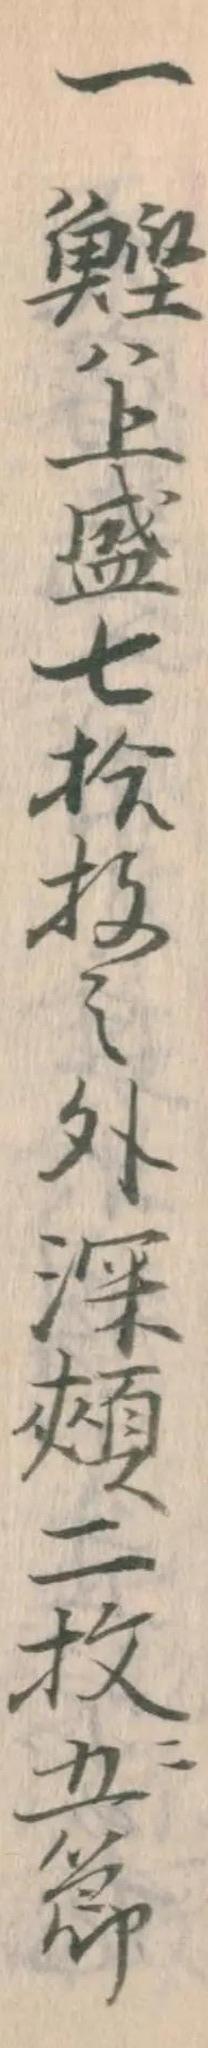一鰹は上盛七拾枚之外深頬二枚に五節
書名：賀茂社記録. 第81冊
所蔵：国立国会図書館 National Diet Library, JAPAN
